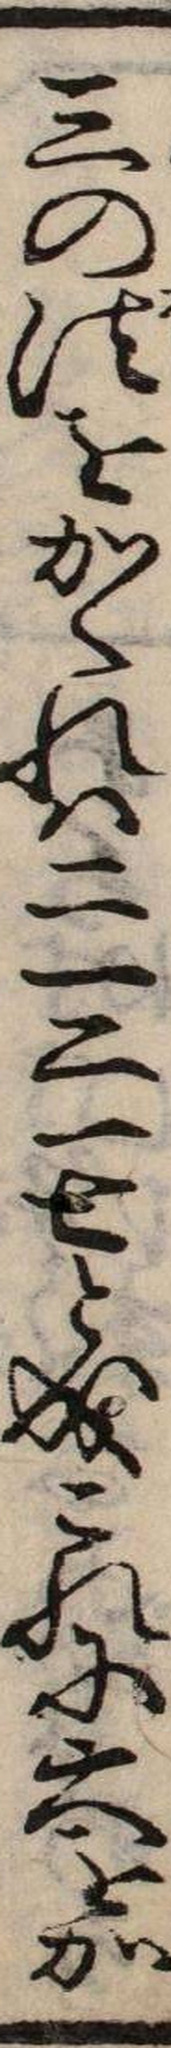三の法をかくれは二一二一七と成これに六をか
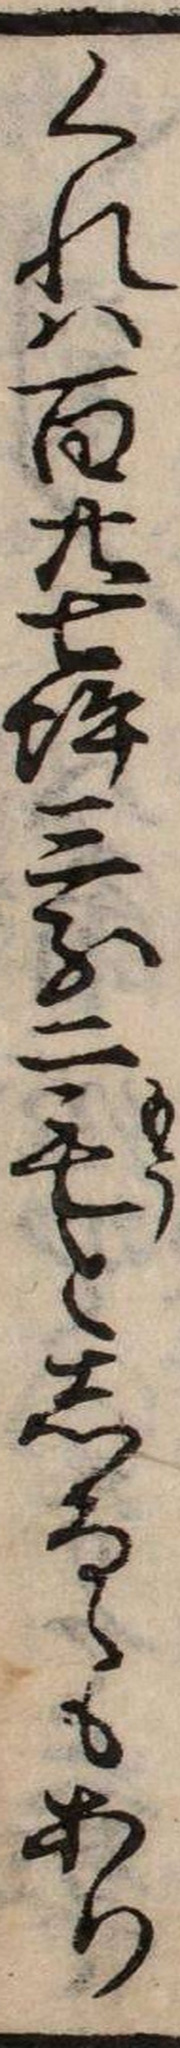くれは百廿七坪三分二毛としるゝもあり

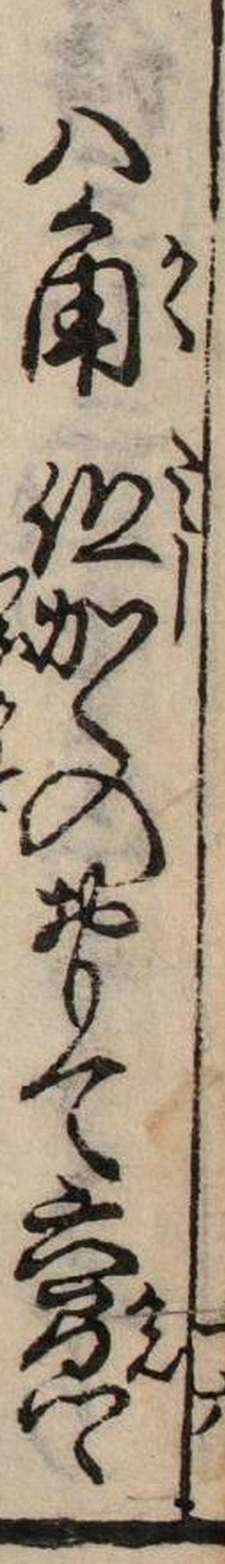八角但かくのおもて六間つゝ
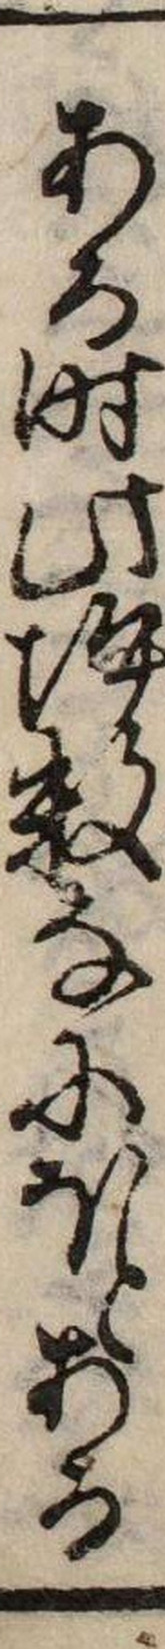ある時此坪数なにほとある
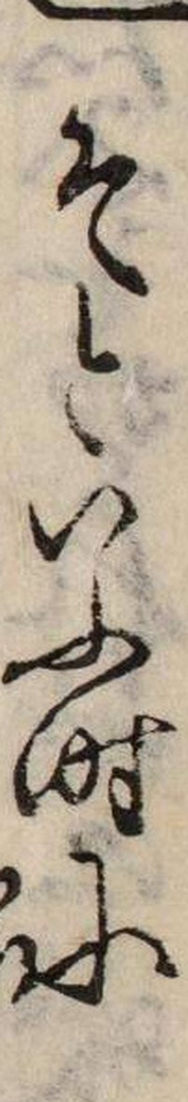そといふ時に
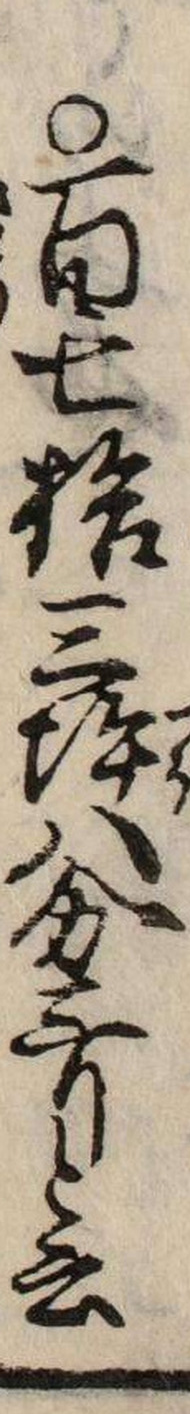○百七拾三坪八分三りと云
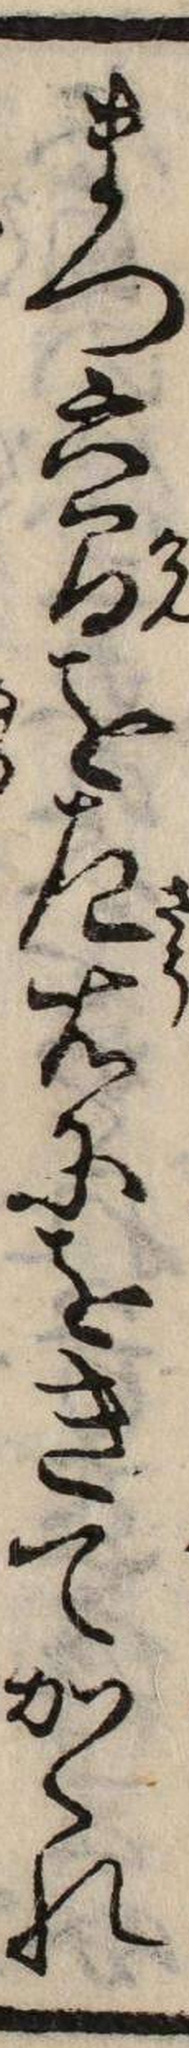まつ六間を左右にをきてかくれ
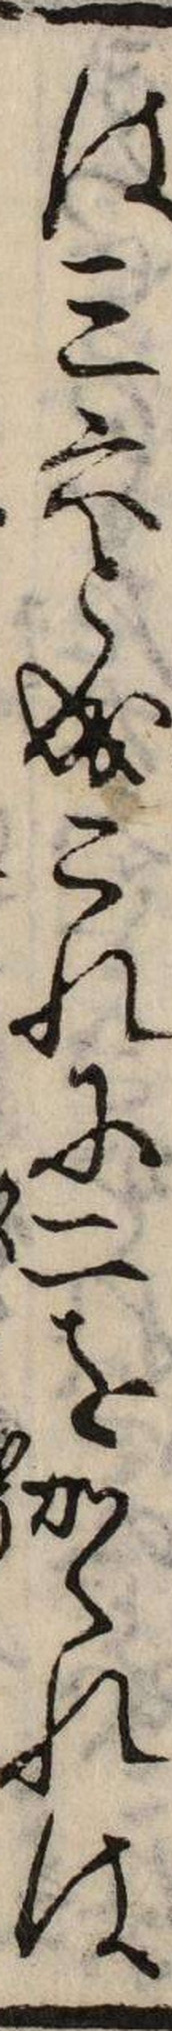は三六と成これに二をかくれは
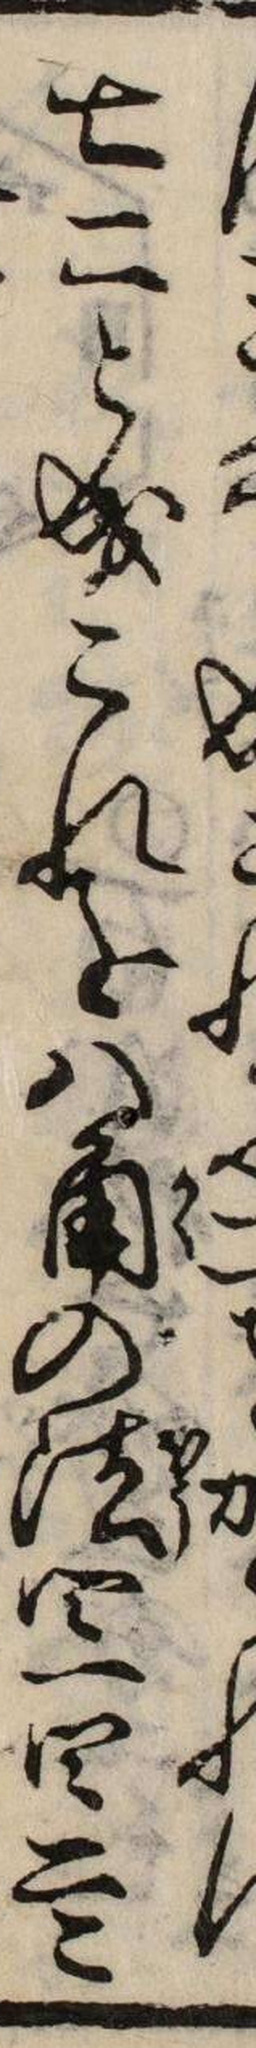七二と成これを八角の法四一四二こ
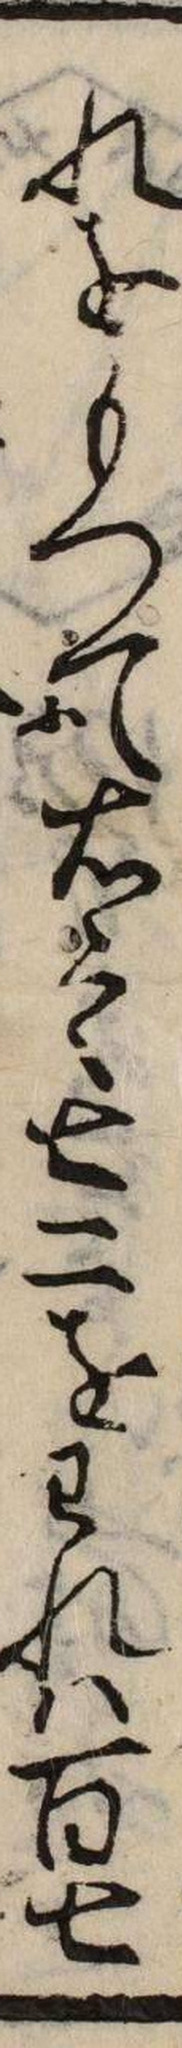れをもつて右の七二をわれは百七
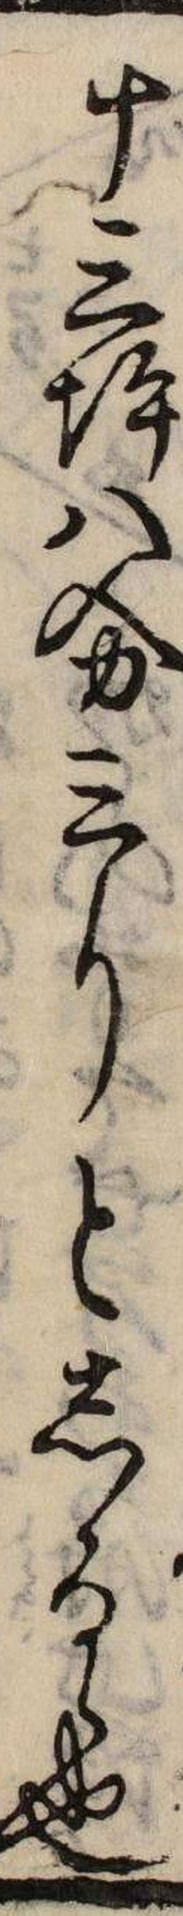十三坪八分三りとしるゝ也
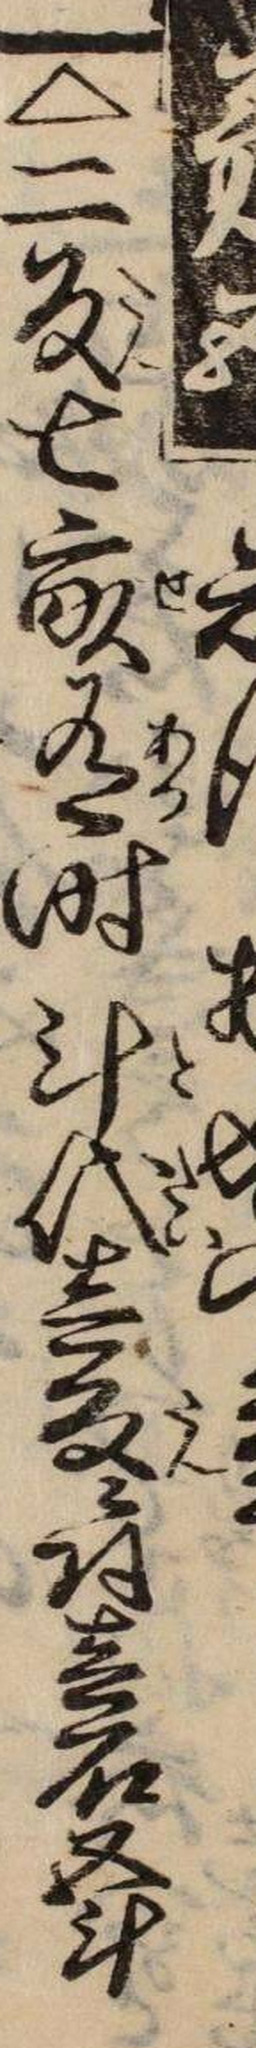△二反七畝有時斗代壱反に付壱石五斗
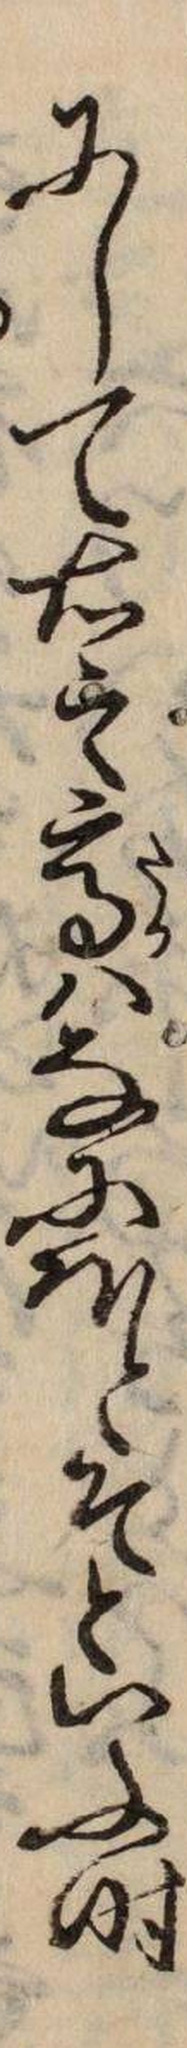にして右の高はなにほとそといふ時
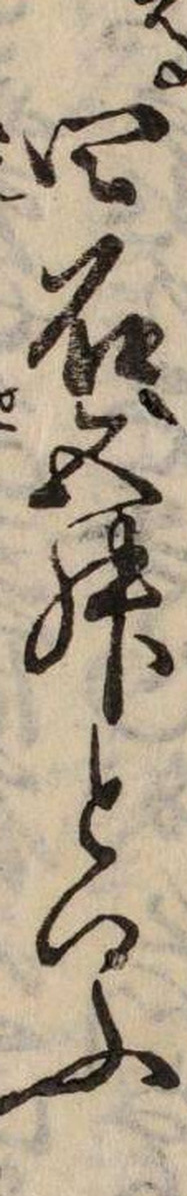高四石五舛といふ
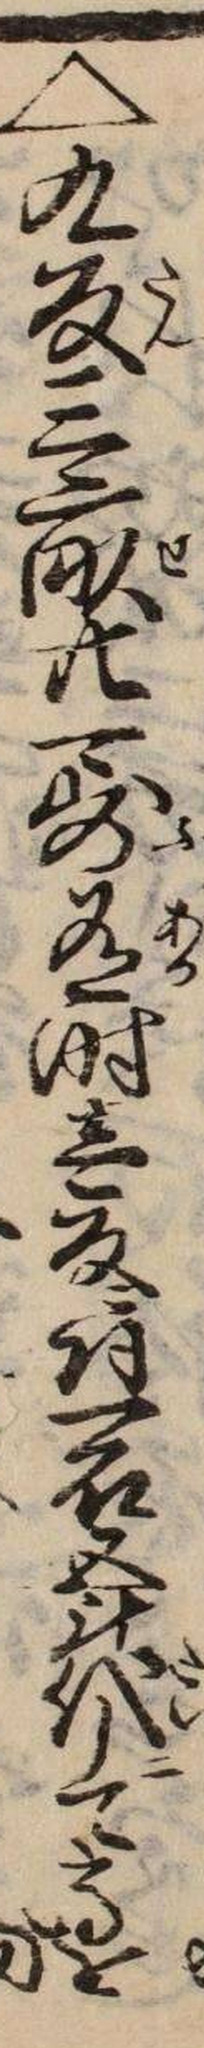△九反三畝廿一歩有時壱反に付一石五斗代にして高を問
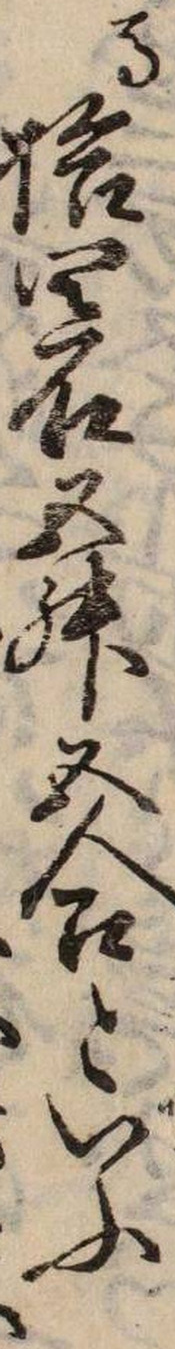高拾四石五舛五合といふ
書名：塵劫記（寛永11年自跋、京都府立京都学・歴彩館追貴8）
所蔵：京都府立京都学・歴彩館 国文学研究資料館
